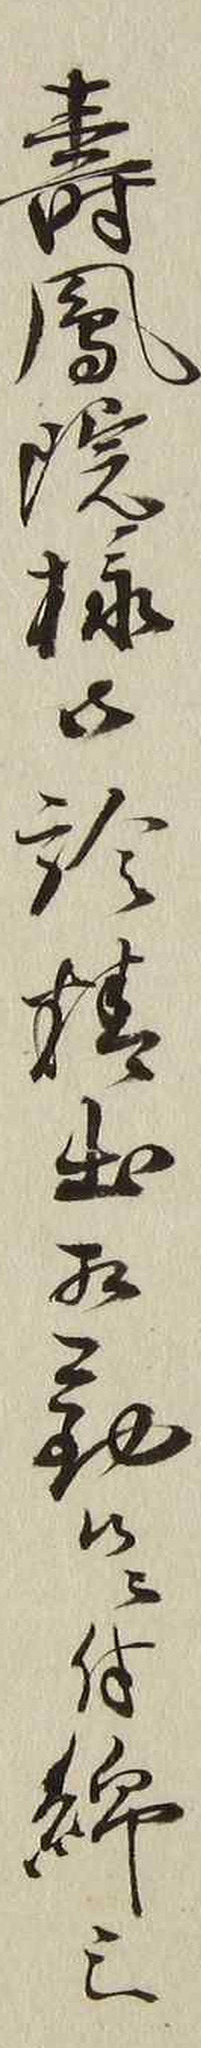寿鳳院様御診精出相勤候に付綿三
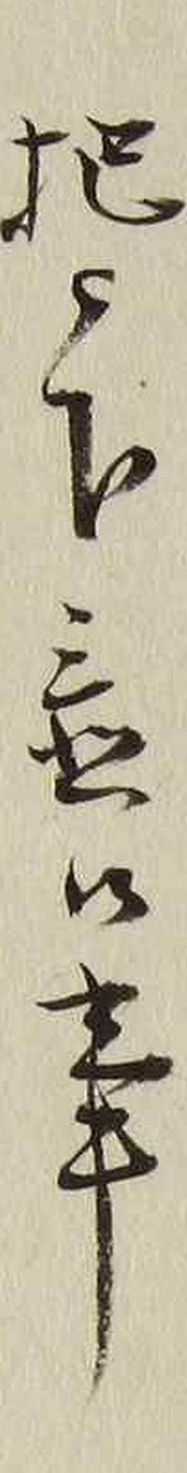把被下置候事
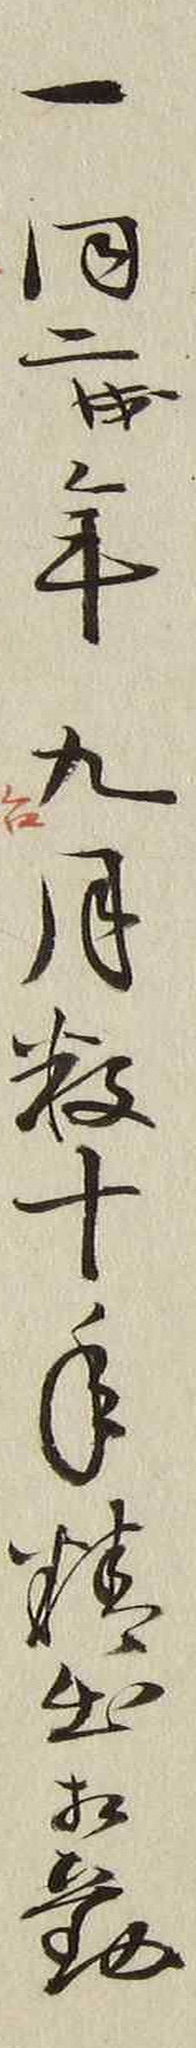一同二戌年九月数十年精出相勤
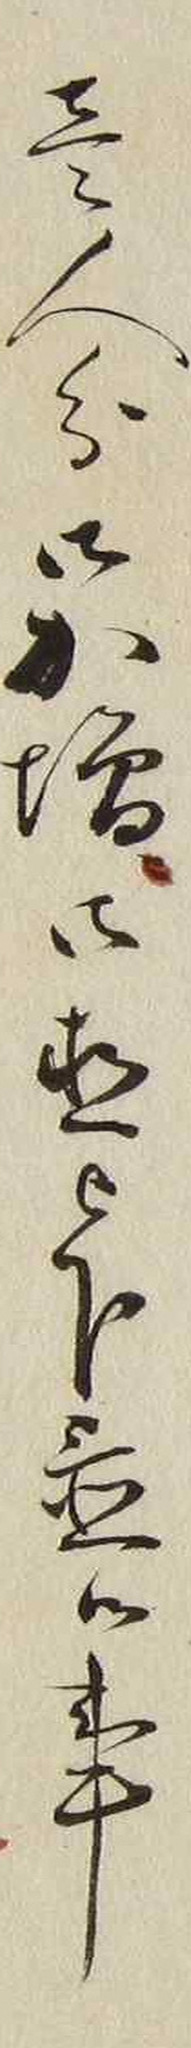壱人分御加増御直被下置候事

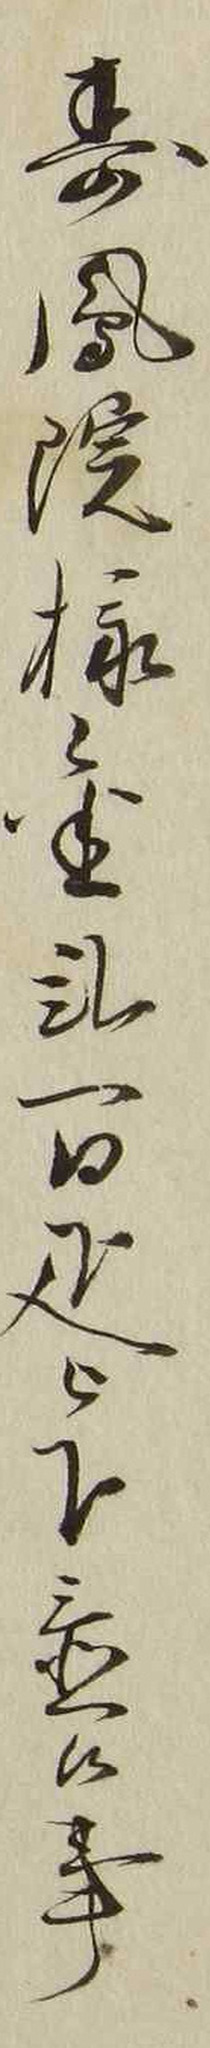寿鳳院様金弐百疋被下置候事
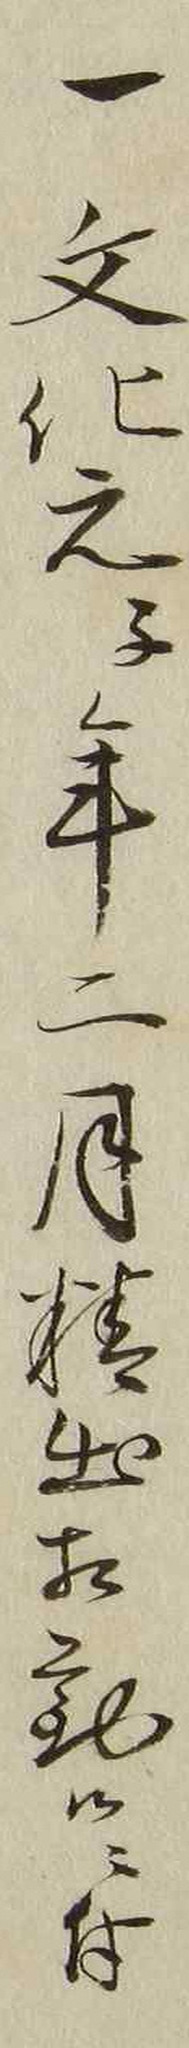一文化元子年二月精出相勤候に付
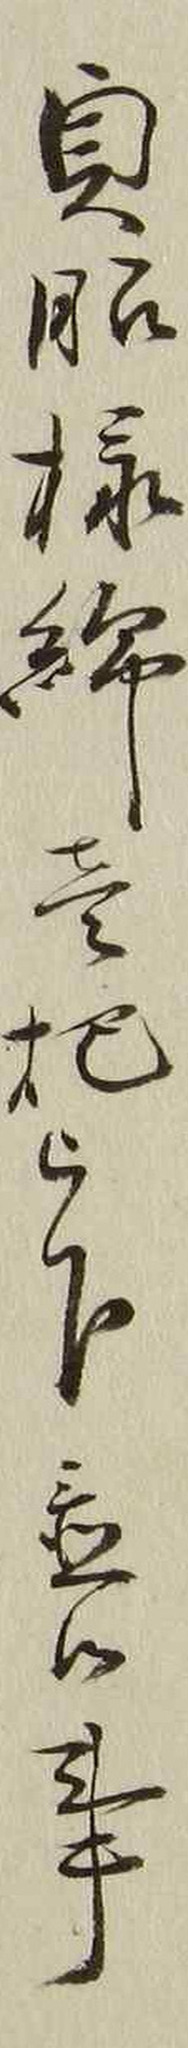貞昭様綿壱把被下置候事
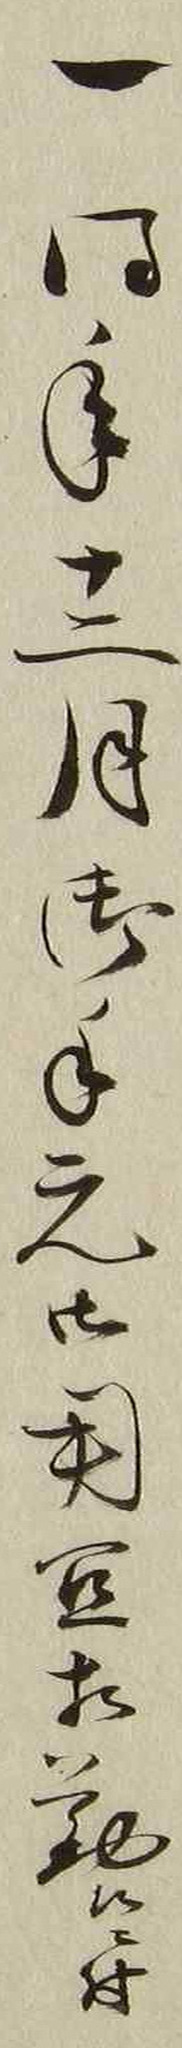一同年十二月御手元御用宜相勤候に付
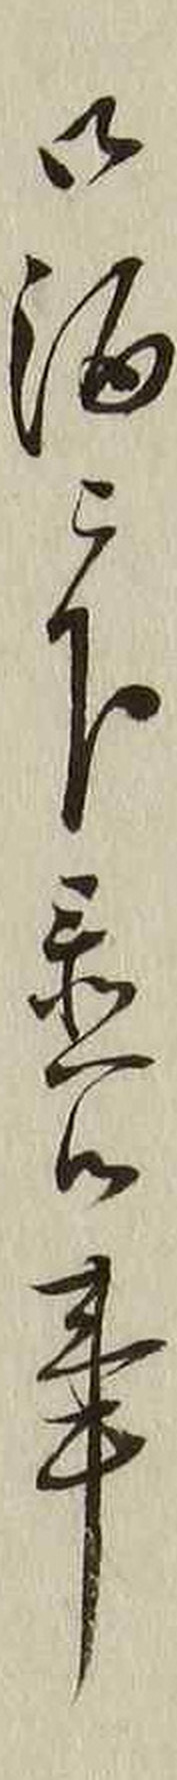御酒被下置候事
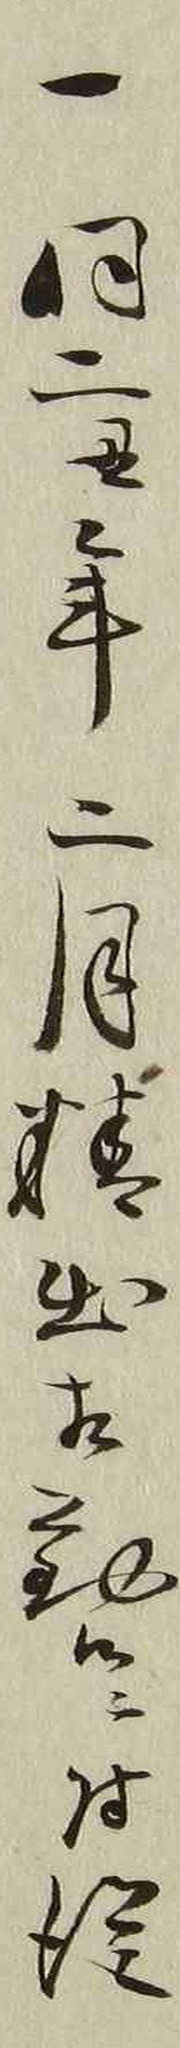一同二丑年二月精出相勤候に付従
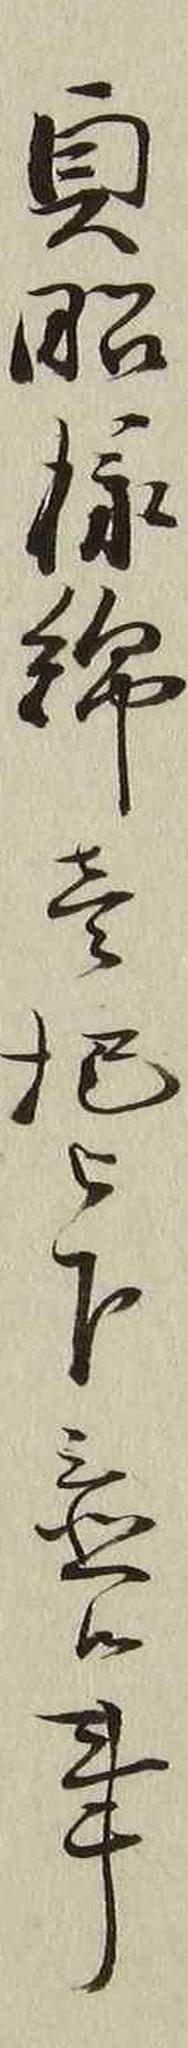貞昭様綿壱把被下置候事
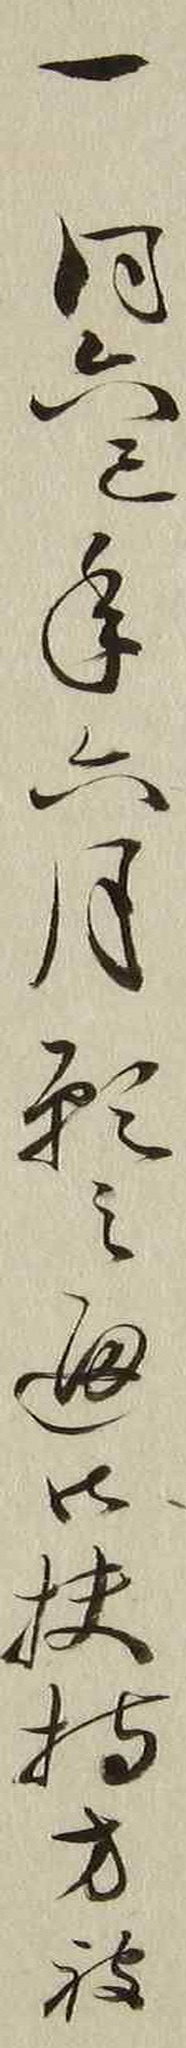一同六巳年六月願之通御扶持方被
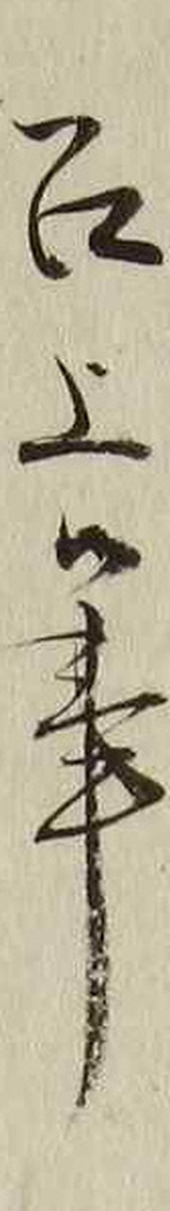召上候事
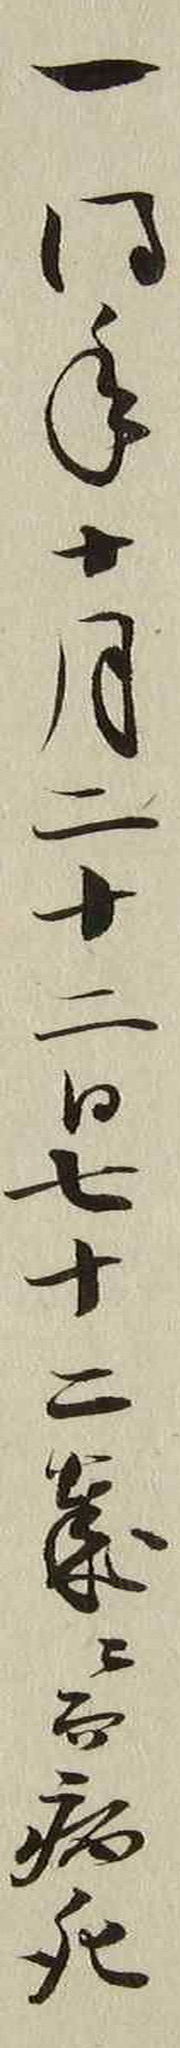一同年十月二十二日七十二歳に而病死
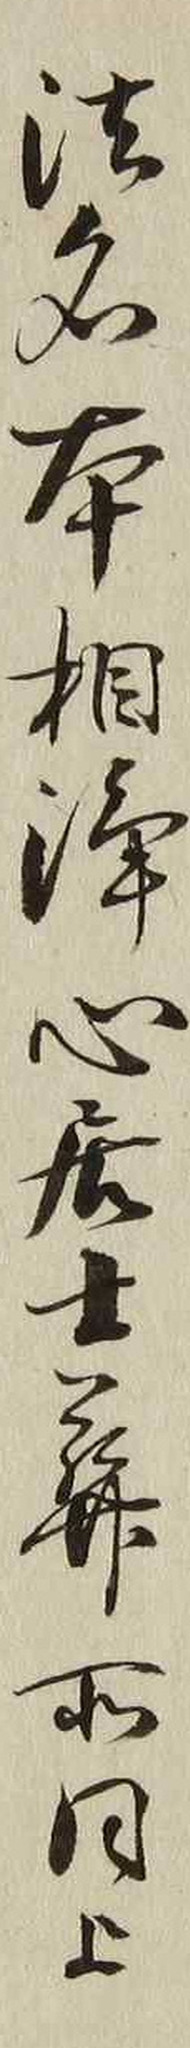法名本相浄心居士葬所同上
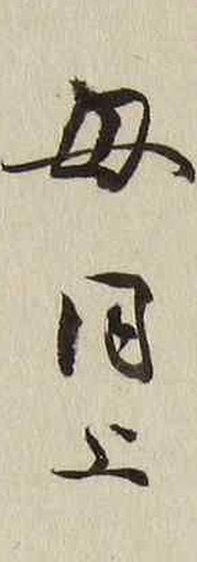母同上
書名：諸士系譜　巻之157　ね之部1
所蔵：会津若松市立会津図書館
